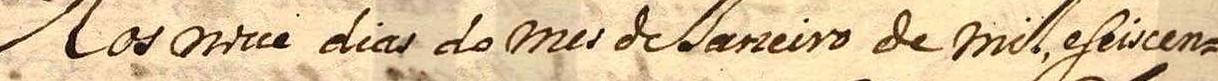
Aos noue dias do mes de Janeiro de mil, e seiscen
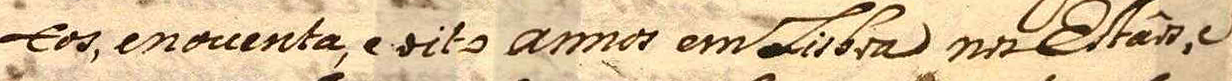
tos, e nouenta, e oito annos em Lisboa nos Estâos, e
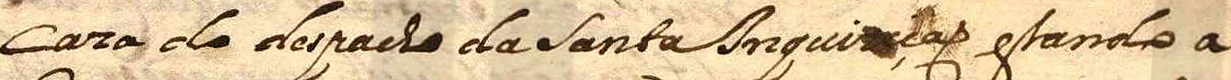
Caza do despacho da Santa Inquiziçaõ estando a
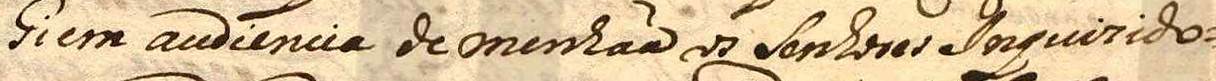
hi em audiencia de menhaã os Senhores Inquizido
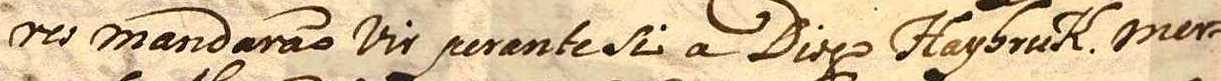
res mandarão vir perante si a Diogo HaybruK. mer
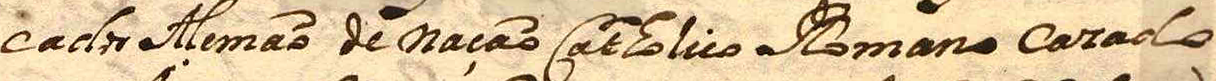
cador Alemaõ de nação Catholico Romano cazado
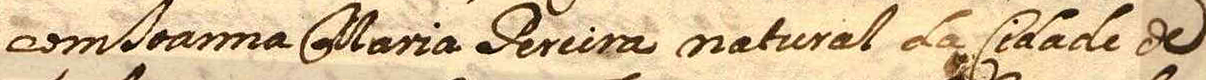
com Joanna Maria Pereira natural da Cidade de
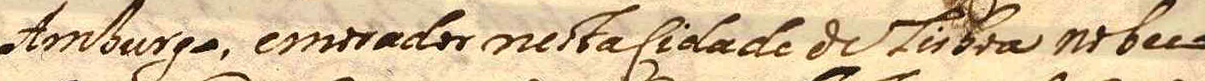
Amburgo, e morador nesta Cidade de Lisboa no beco
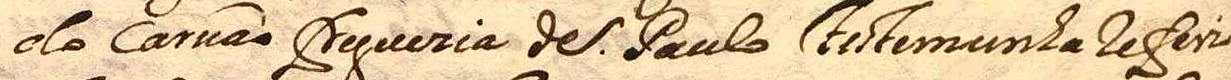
do Caruão freguezia de S. Paulo testemunha Referi
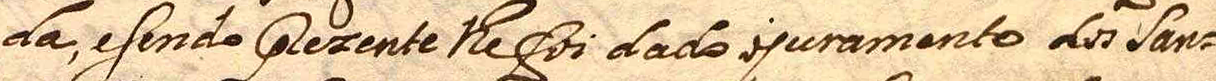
da, e sendo prezente lhe foi dado o juramento dos San
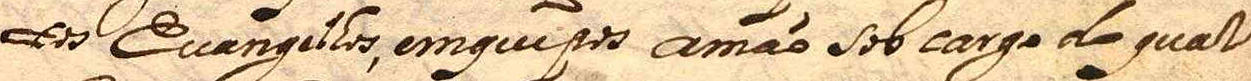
tos Euangelhos, em que pos a maõ sob cargo do qual
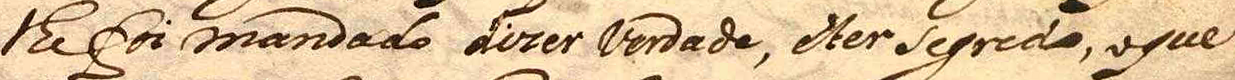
lhe foi mandado dizer verdade, e ter segredo, o que
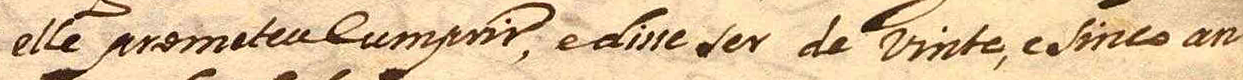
elle prometeu Cumprir, e disse ser de vinte, e sinco an
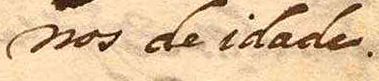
nos de idade.
